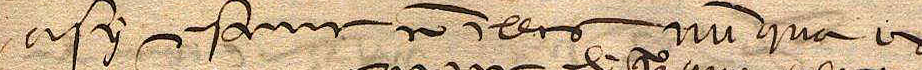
asy esteue cō elles nūqua os
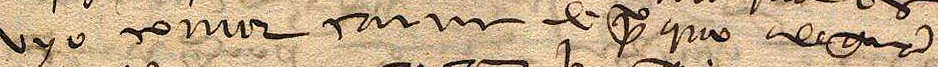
vyo comer carne de p̄oquo allguā
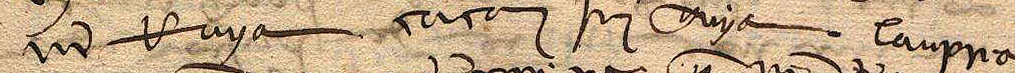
nē Raya caçam Jmguya lanprea
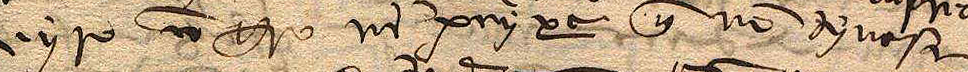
eyro c̄ogro nē peyxe q̄ nō tyuese
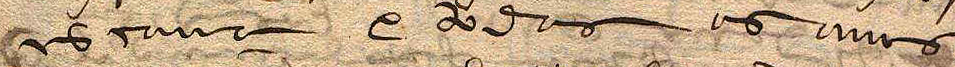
escama e todas as aues
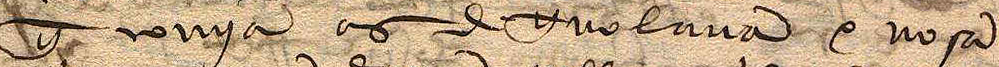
q̄ comjā as deguolauā e no sā
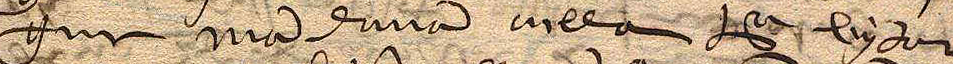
gue mādauā a ella tsa deytar
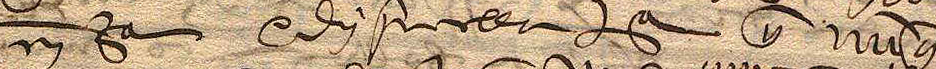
cȳza e dyse ella tsa q̄ nūq̄a
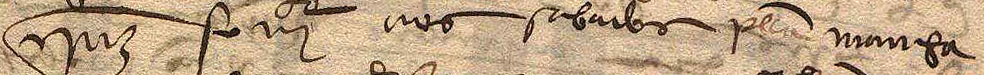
cruz somte aos sabados pl̄la manha
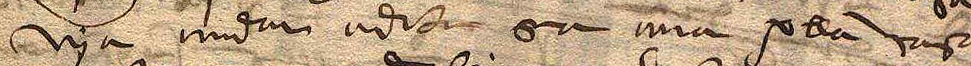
vya andar a dita sua ama pllā casa
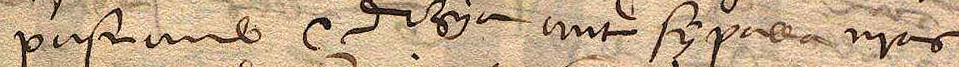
paseando e dizya ant̄ sy pallauras
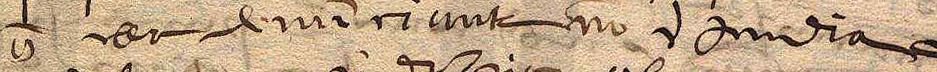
q̄ ella denūciante n̄o ētendia e
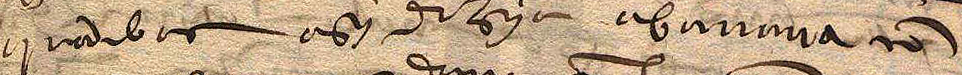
quādo as asy dizya abanaua cō
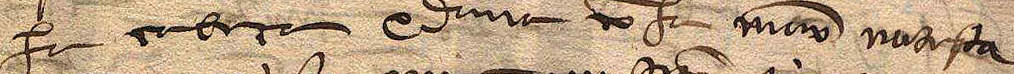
ha cabeça e daua c̄o ha mão na testa
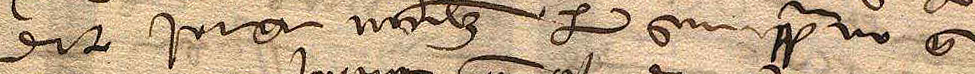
dito Jorge mēdez ho seu esp̄uo q̄
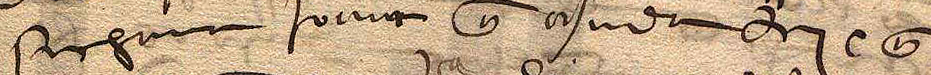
se chama Joanne q̄ aJnda tem e q̄
